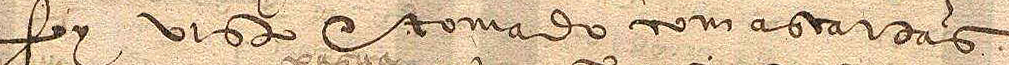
foy visto e tomado com as cartas
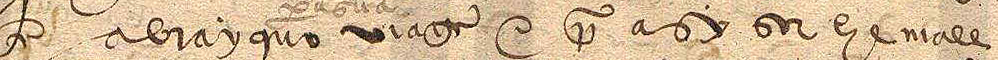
ē abrayquo ꝑ a sua viagē e p̄o asy ser he mall
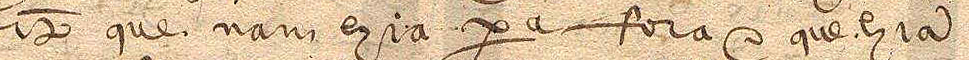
dito que nam hia ꝑa fora e que hiā
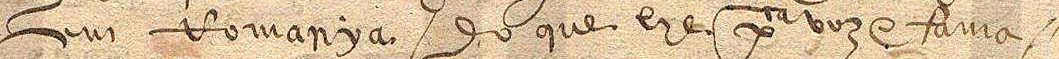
em Romarrya / do que he pca voz e fama //
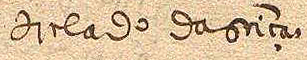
trelado da snç̄a
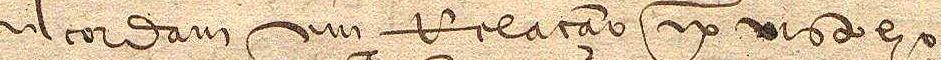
Acordam em Relação c̄ꝭ visto ho
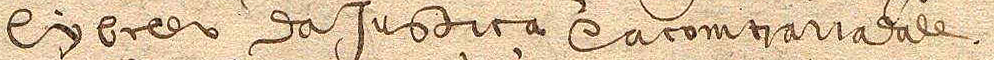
lybello da Justiça e a comtrariadade
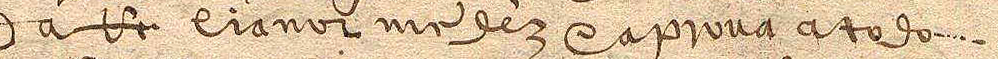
da Re lianor mēdez e a proua a todo
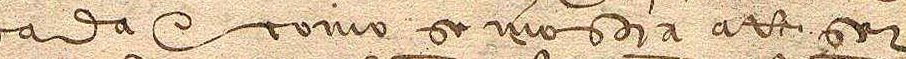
dada e como se mostra a Re ser
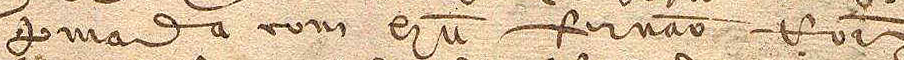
tomada com hū fernão Roīz
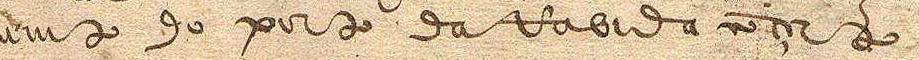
Jumto do porto da Rabida c̄o çerto
